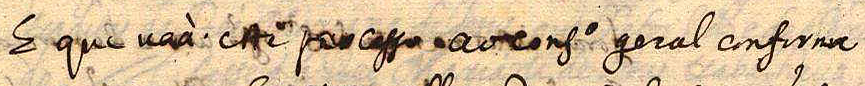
E que uaà este processo ao conso geral conforme
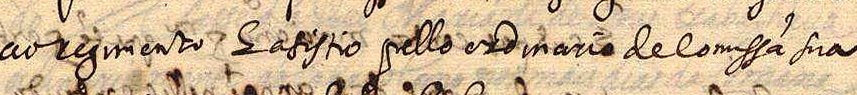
ao regimento E asistio pello ordinario de comissā sua
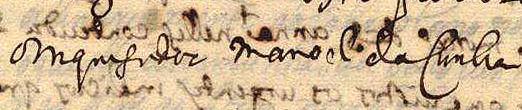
o inquisidor manoel da Cunha
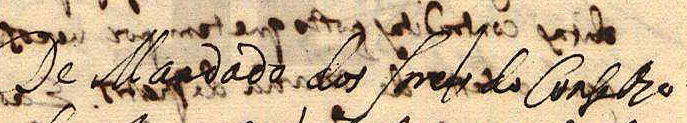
De Mandado dos Snres̄ do Conselho
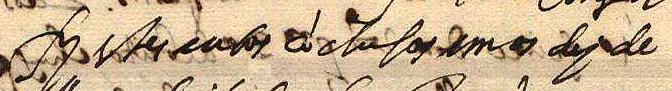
fiz estes autos cōclusos em os dez de
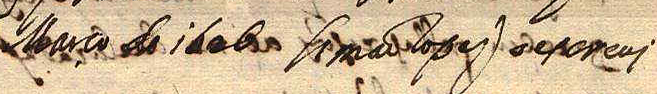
Março de i626 Simaõ lopez o escreuj
